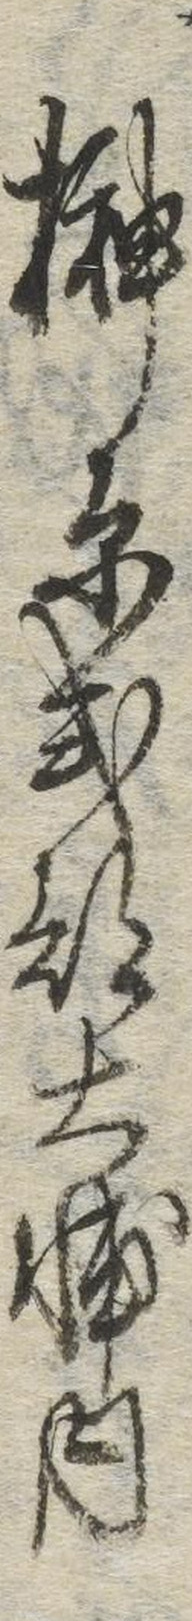榊原式部大輔内
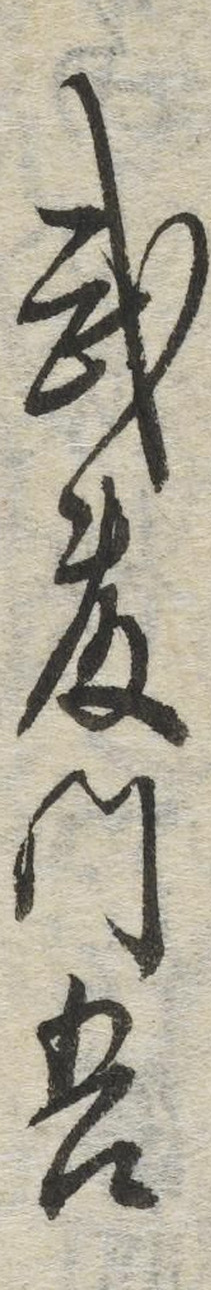武藤門吾
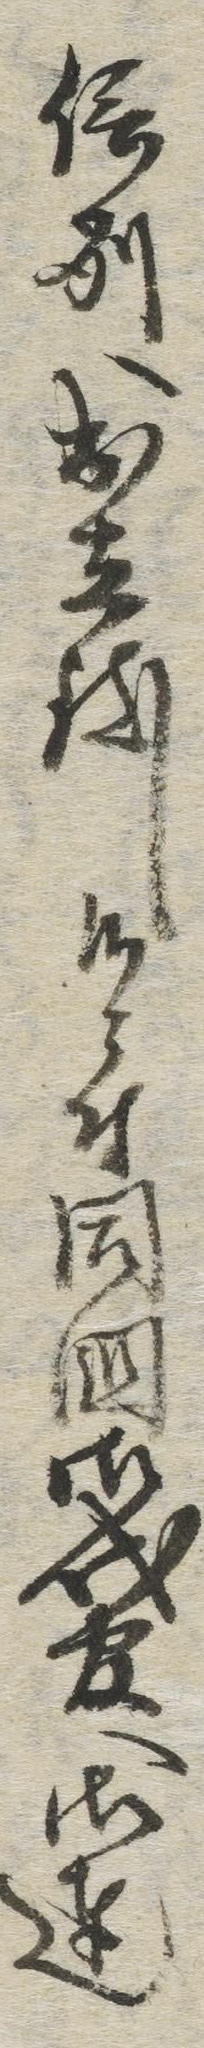信州へ出立致し候二付同国御代官へ御達
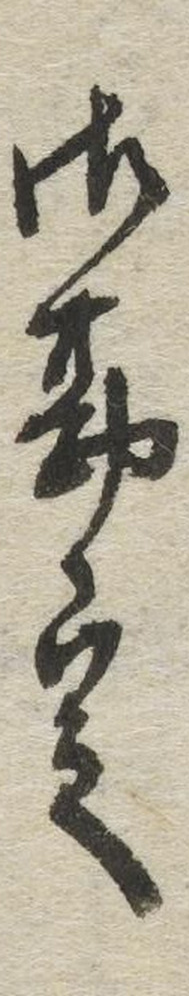御勘定
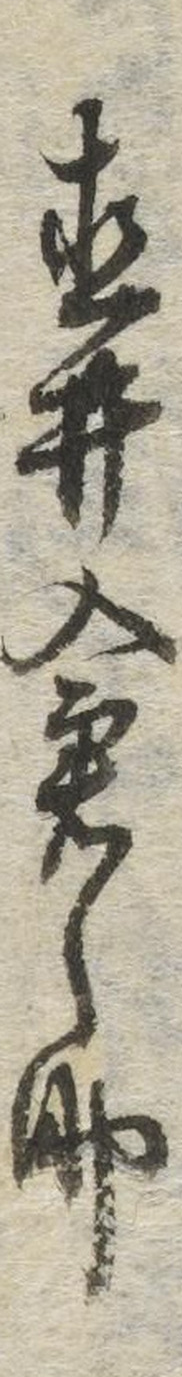直井倉之助
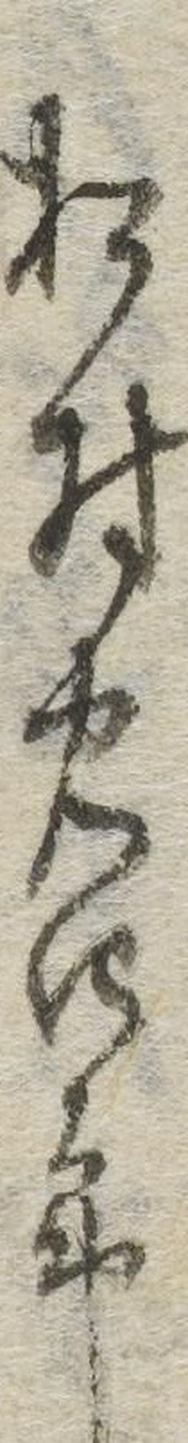松村忠四郎
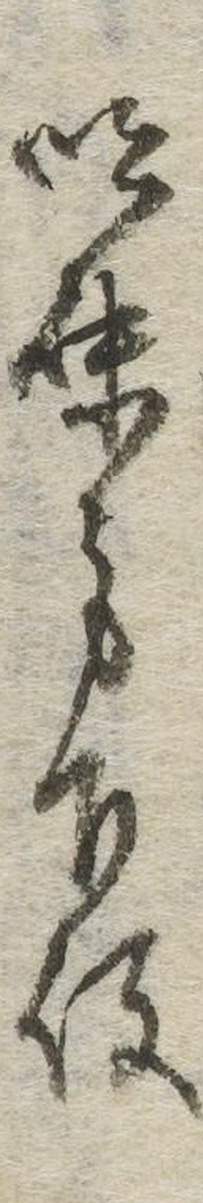吟味方下役
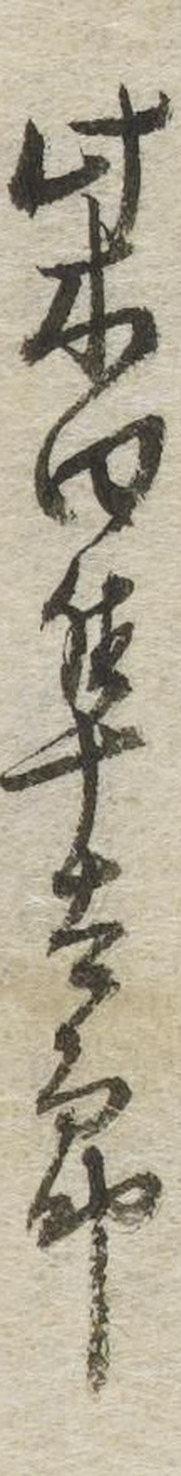柴田隼太郎
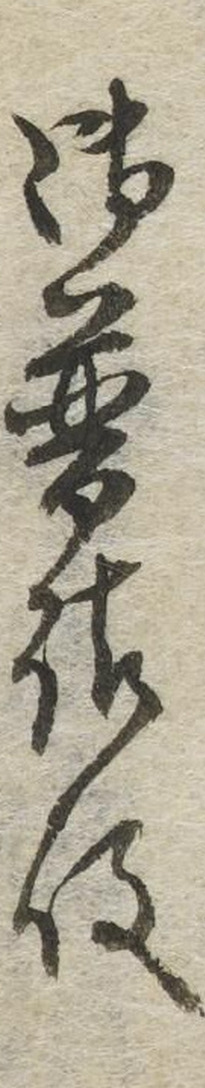御普請役
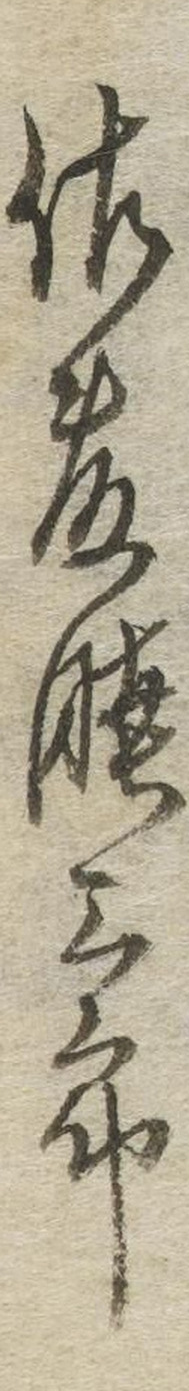佐藤睦三郎

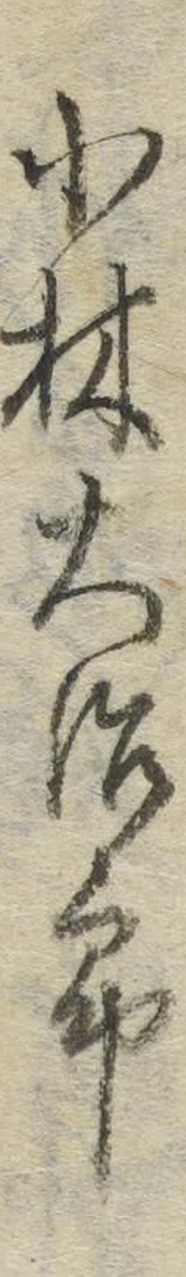小林大治郎
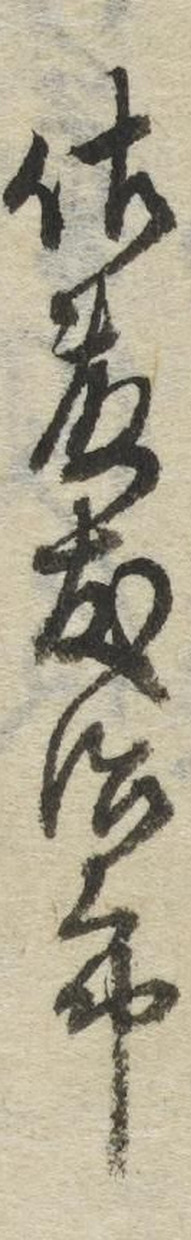佐藤藤治郎
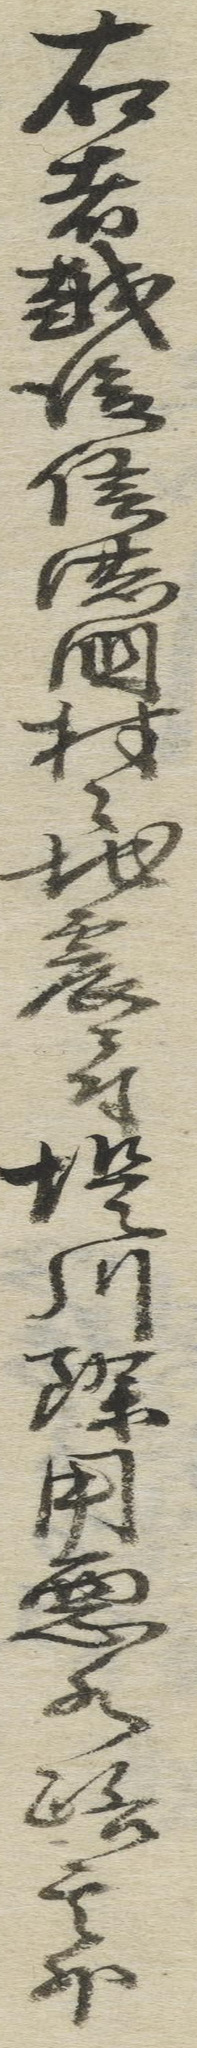右は越後信濃国村々地震二付堤川除用悪水路其外
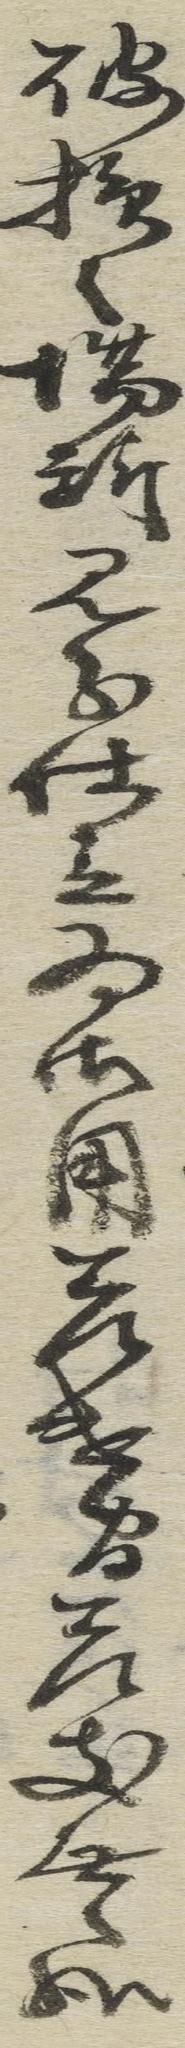破損之場所見分仕度為御用差遣候間差支無之様
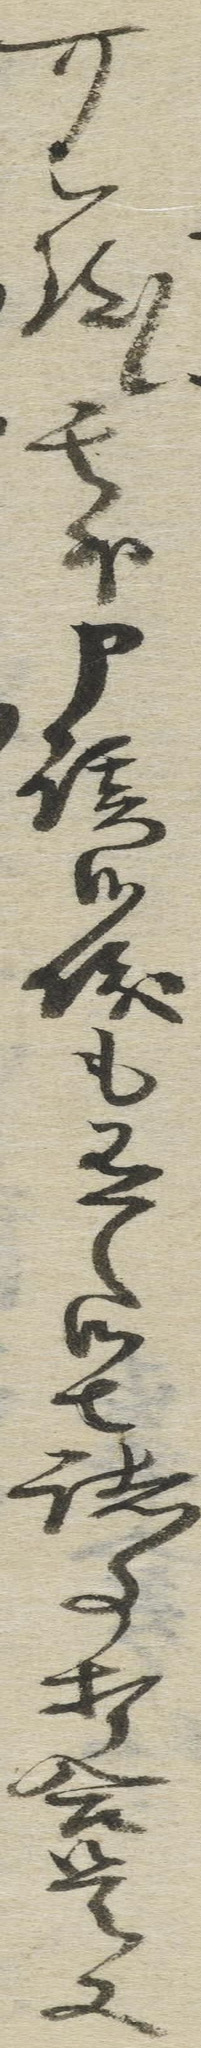可被致候其外申談候儀も有之候は諸事打合且又
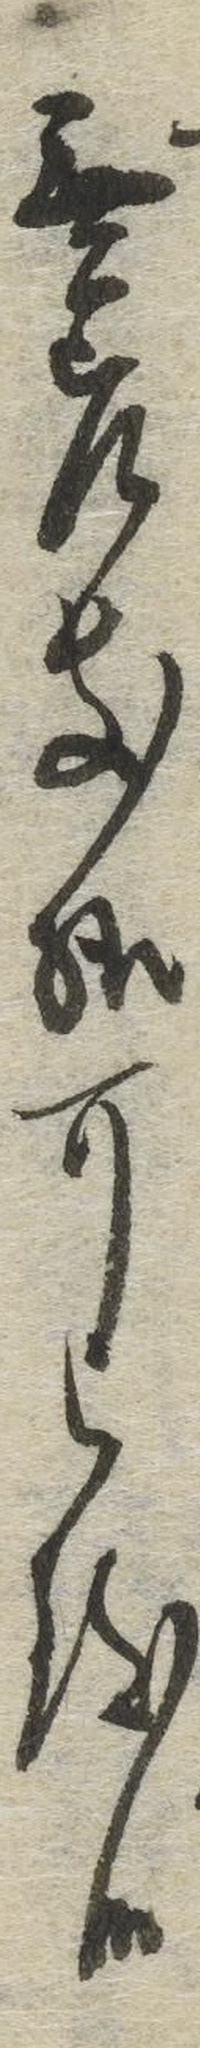無差支様可被致候
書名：信濃越後　地震書留
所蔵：東京大学地震研究所図書室 Earthquake Research Institute Library, The University of Tokyo, JAPAN
